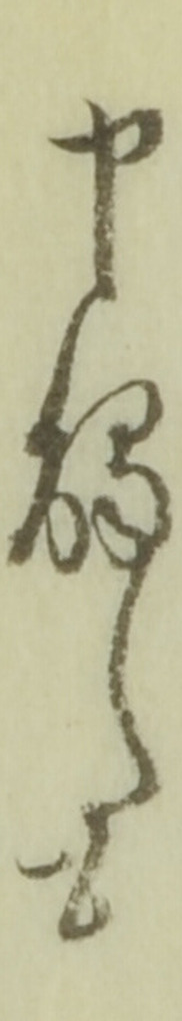申触候以上
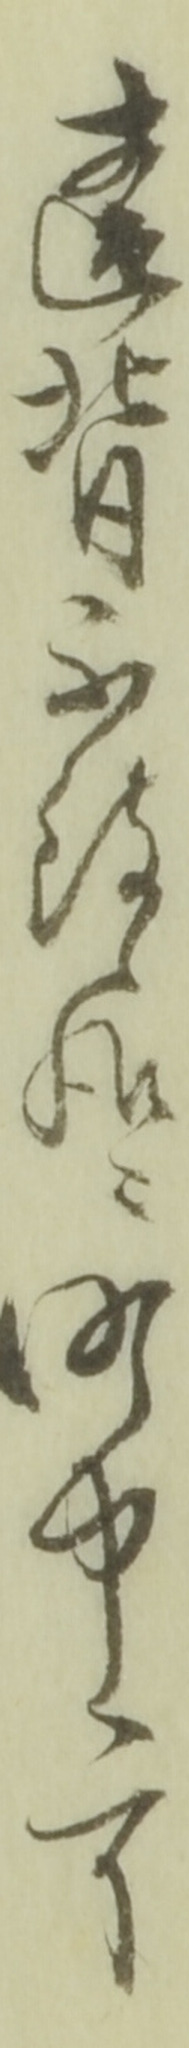違背不致候様二町中二可
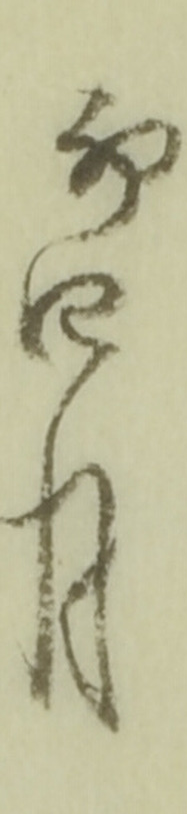卯四月
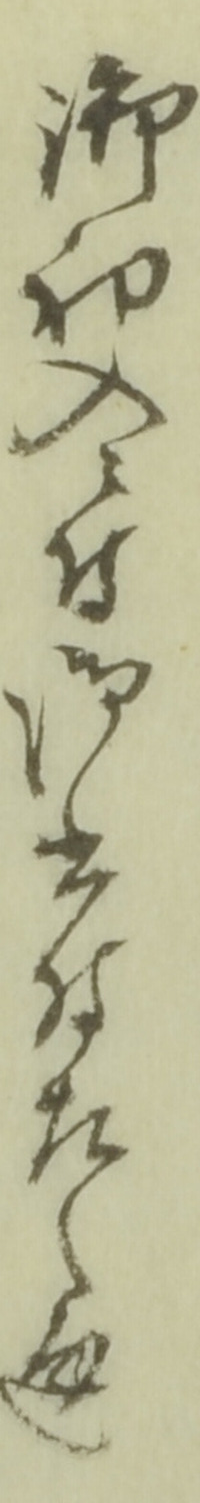御初入二付御出府左之通
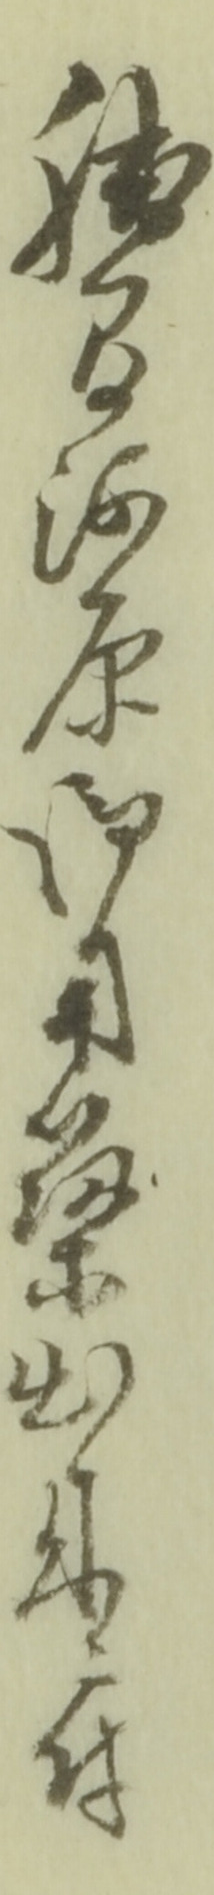勝間河原御用留等出来二付
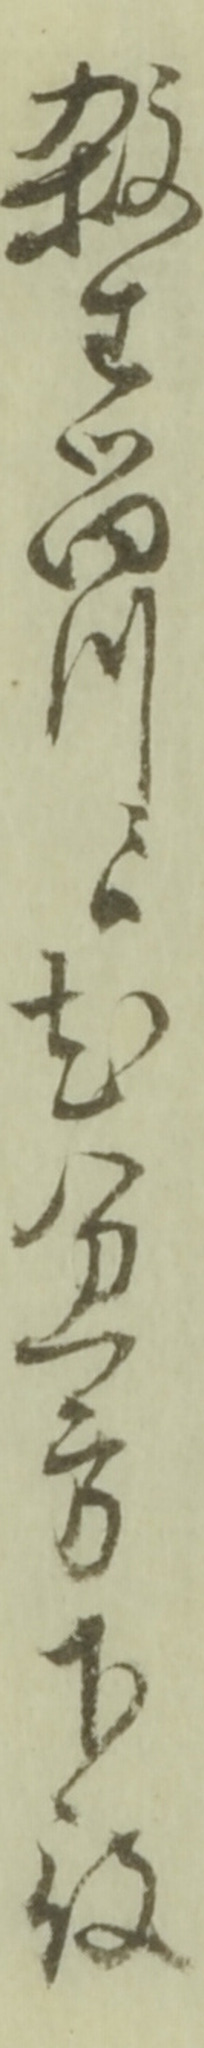殺生留川二候尤分つ方下役
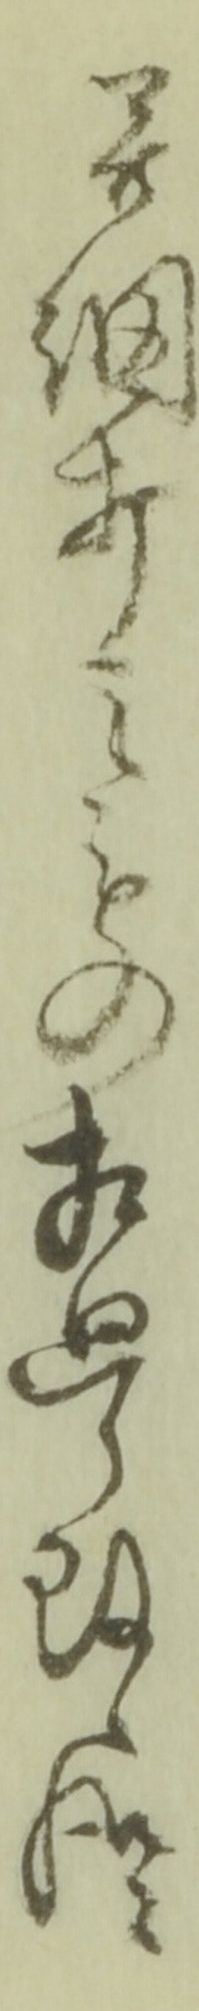並網打之もの相廻り改候様二
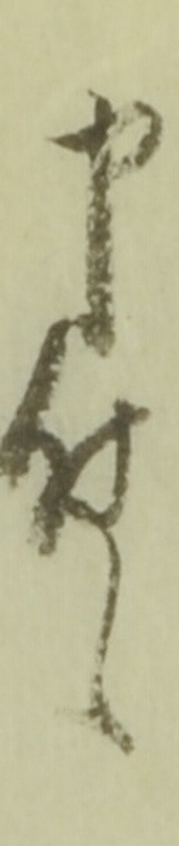申付候
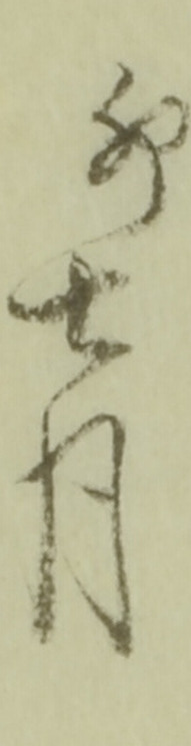卯七月
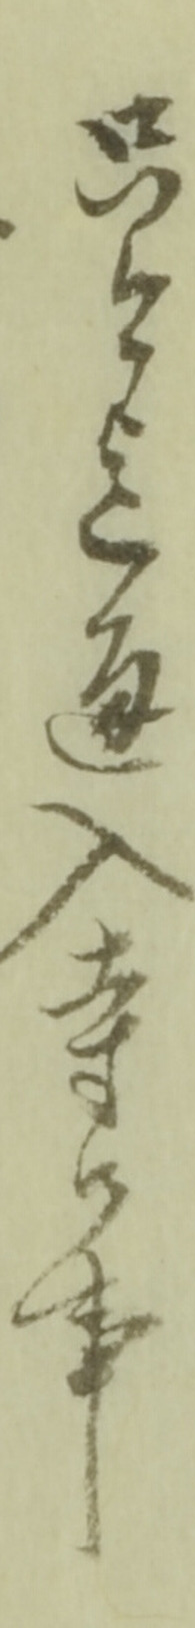只今迄通入寺候事
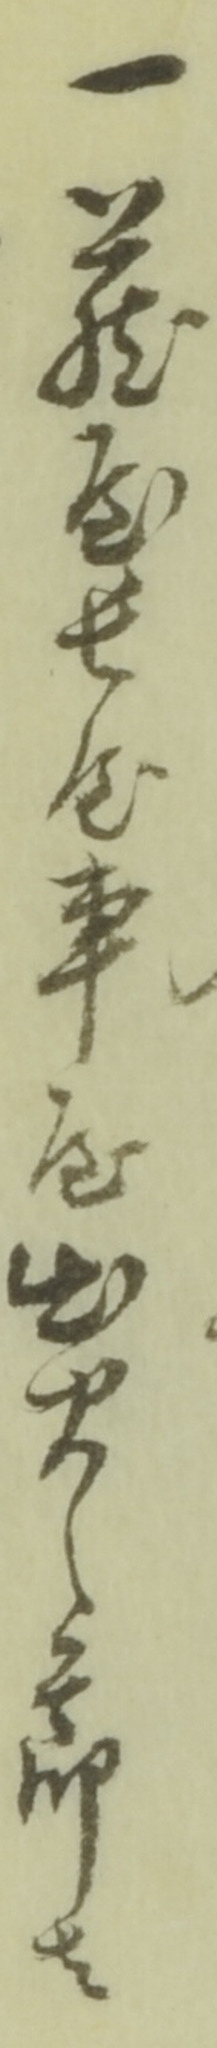一蔵屋長屋車屋出火候其時者
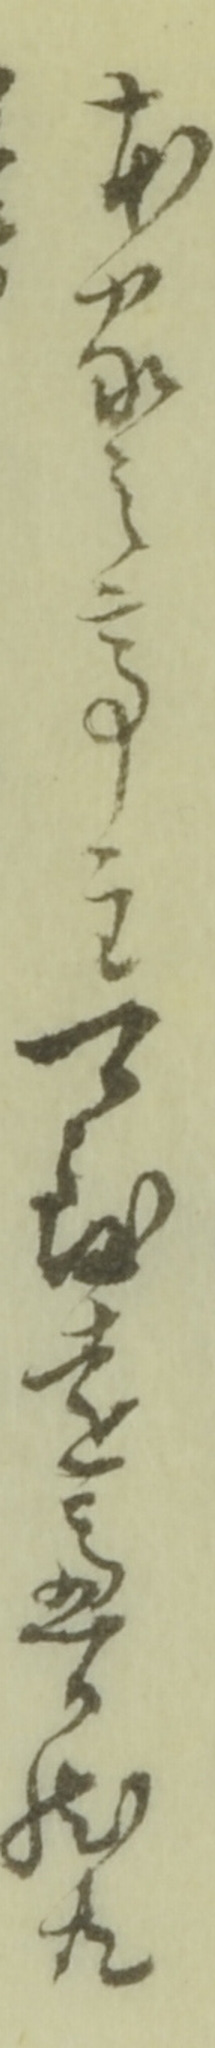本家之高主可致遠慮候然共
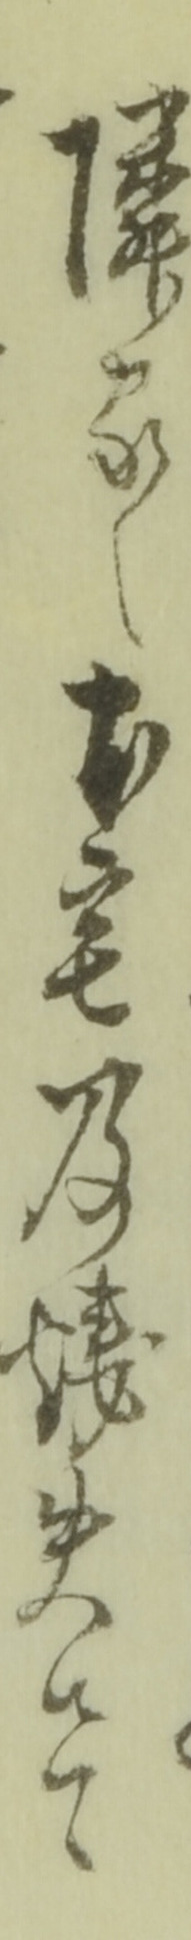隣家之本宅及焼失候ハバ
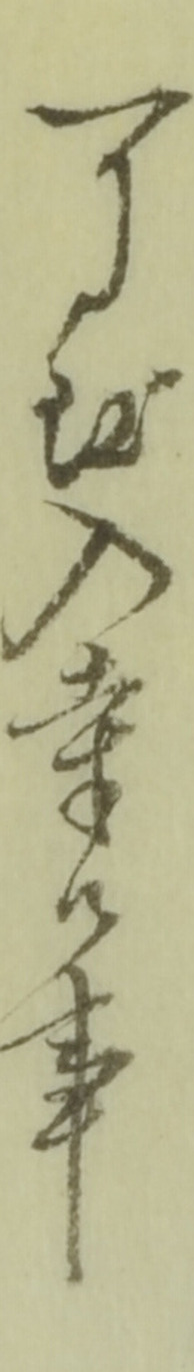可致入寺候事
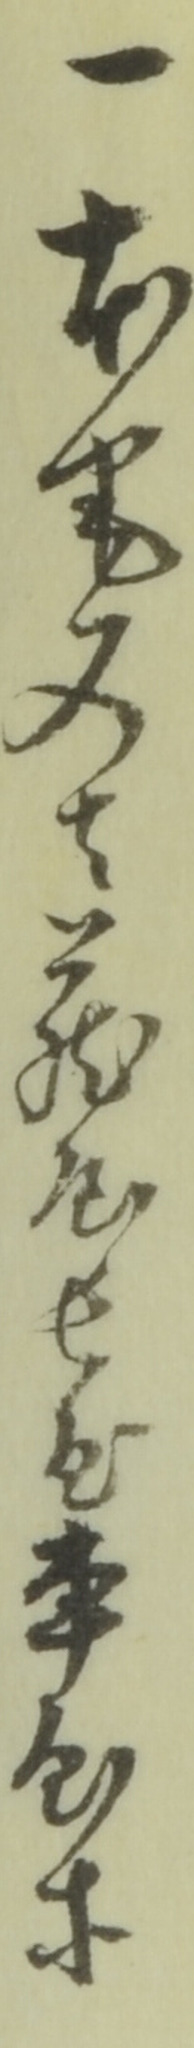一本家又者蔵屋長屋本屋等
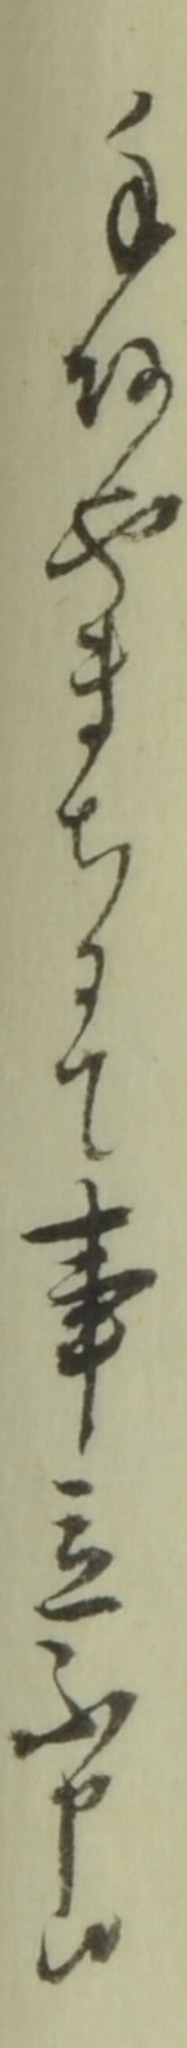手あやまちにて事立不申候
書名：御公儀様御領主様御触書控
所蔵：伊那市立高遠町図書館・合同会社AMANE
